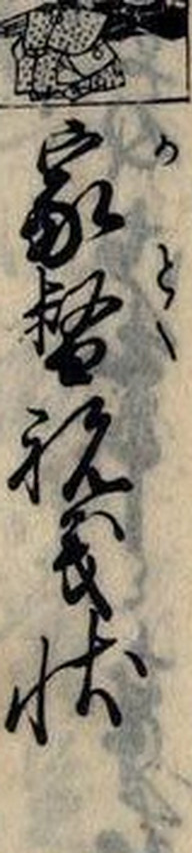家督祝義状
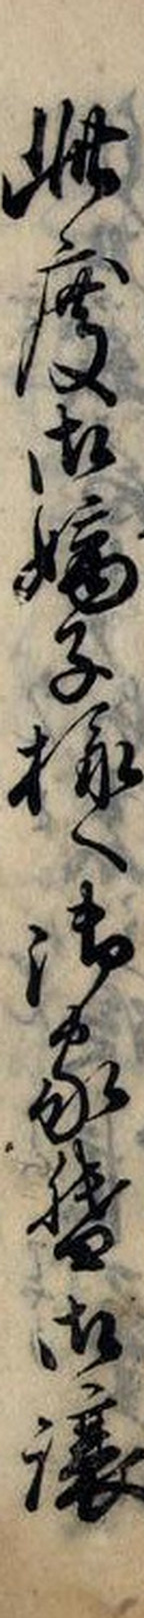此度御嫡子様へ御家督御譲

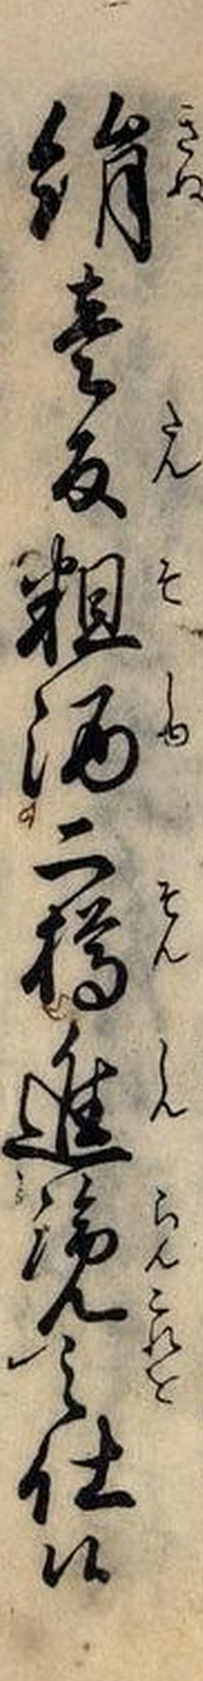絹壱反粗酒二樽進覧之仕候
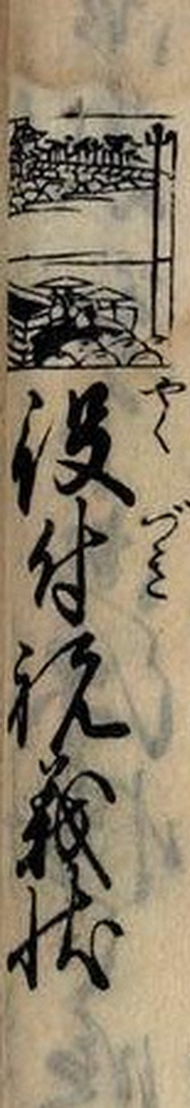役付祝義状
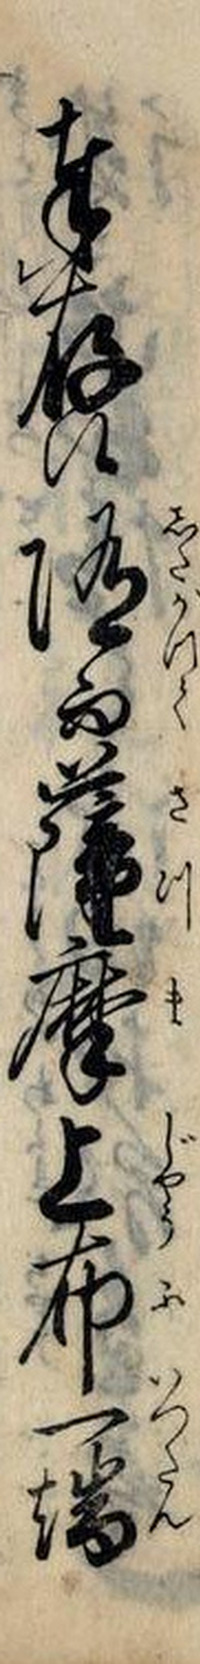奉存候随而薩摩上布一端
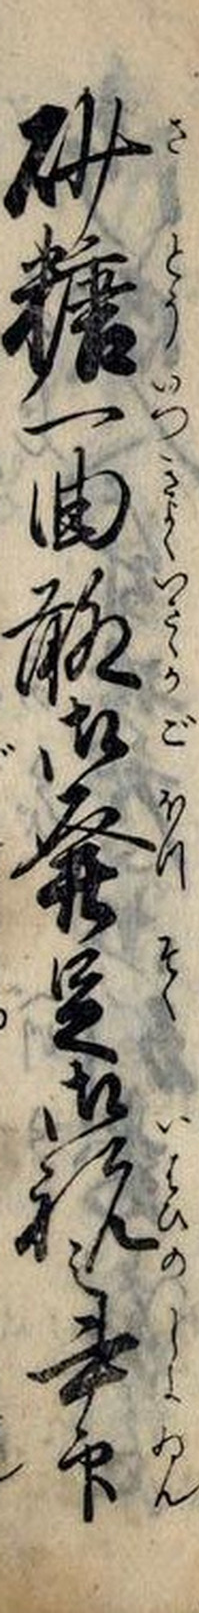砂糖一曲聊御発足御祝之書印
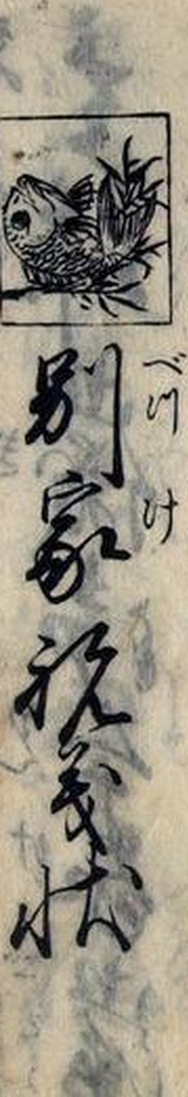別家祝義状
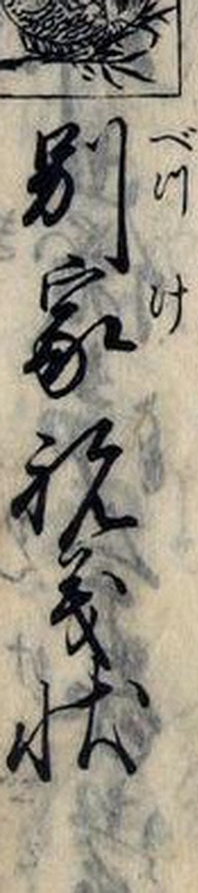別家祝義状

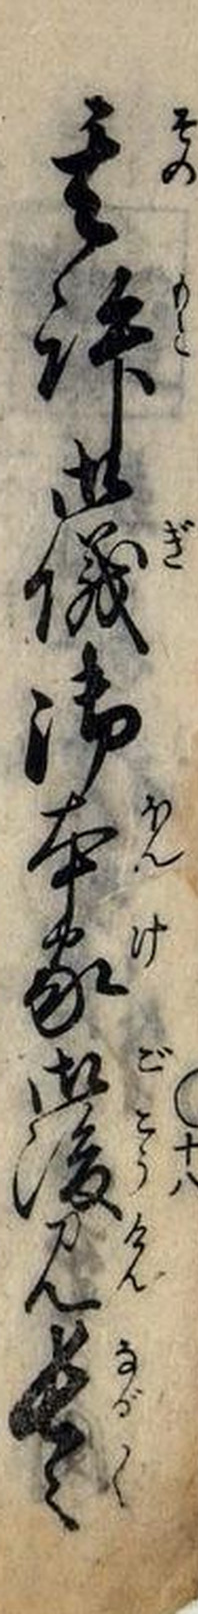其許御儀御本家御後見長々
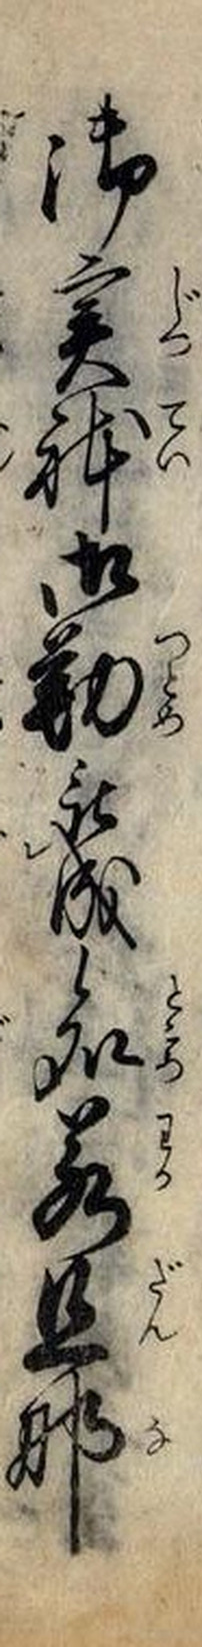御実躰御勤被成候処若旦那
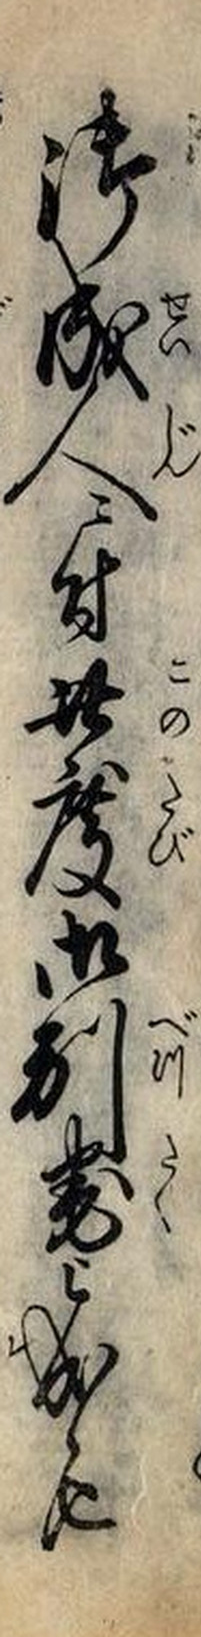御成人に付此度御別宅被成候由
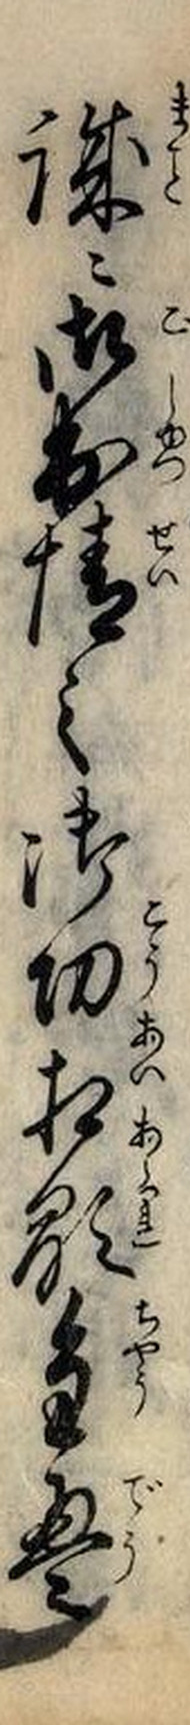誠に御出情之御功相顕重畳
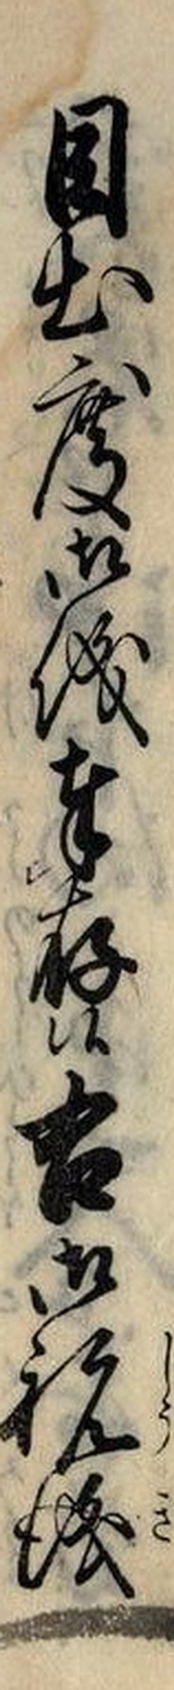目出度御儀奉存候右御祝儀
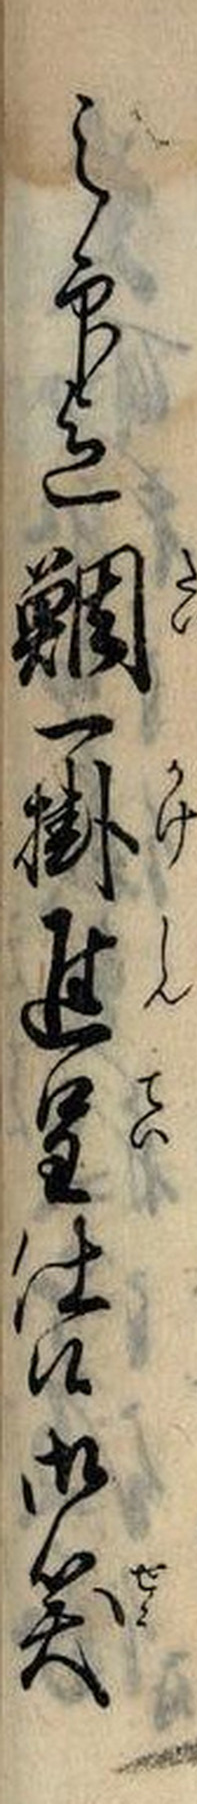之印迄鯛一掛進呈仕候御笑
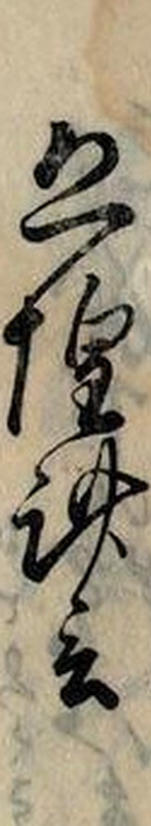恐惶謹言
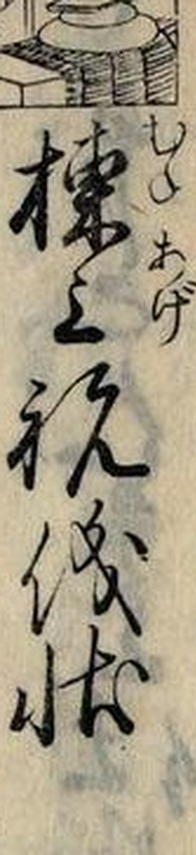棟上祝儀状
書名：大成用文章（往来物）
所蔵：福井県文書館 Fukui Prefectural Archives
